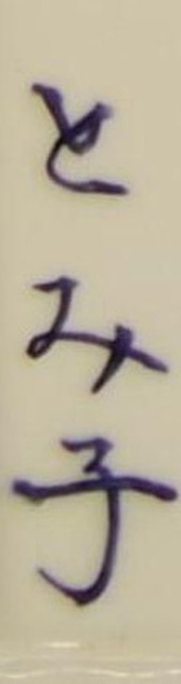とみ子

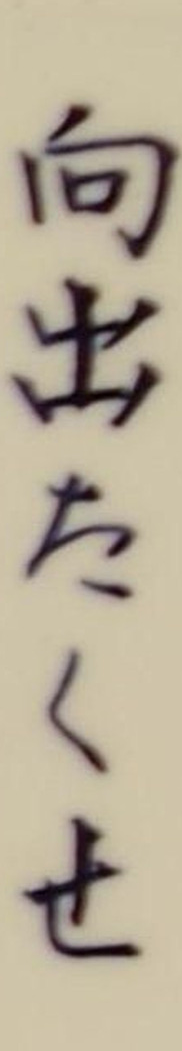向出たくせ
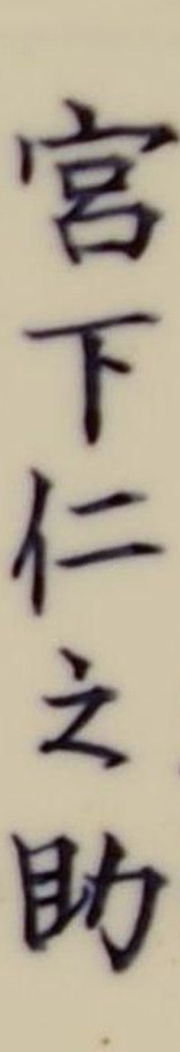宮下仁之助
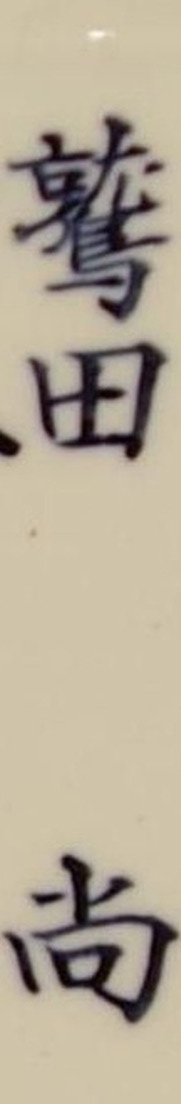鷲田尚
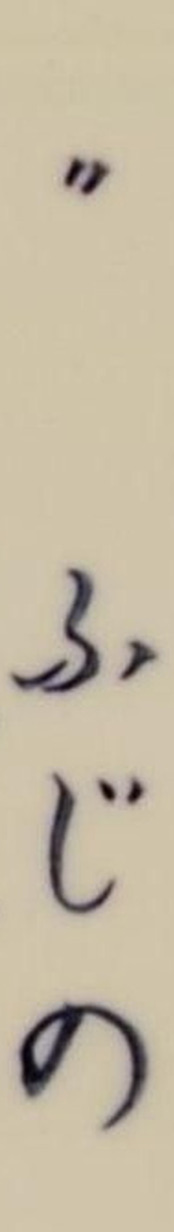ふじの
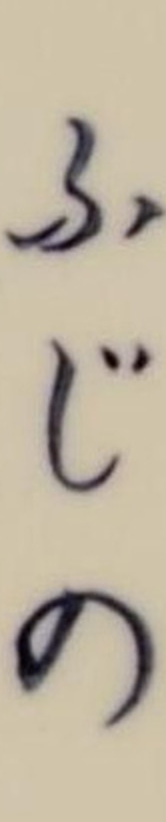ふじの
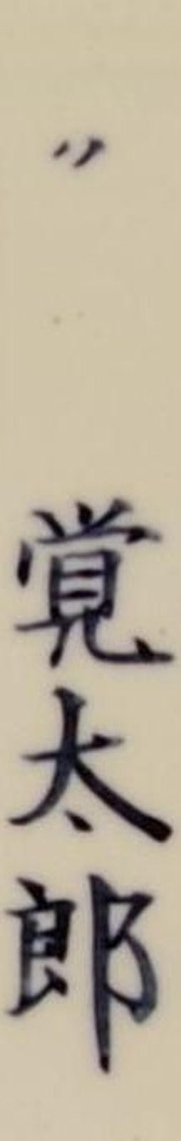覚太郎
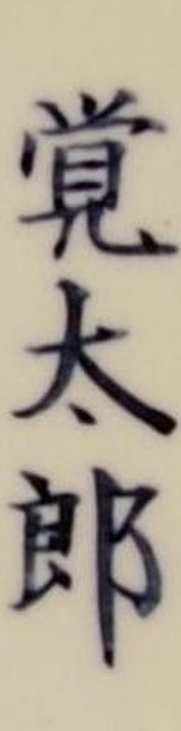覚太郎
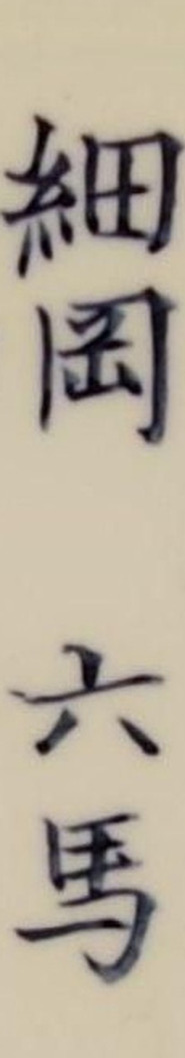細岡六馬
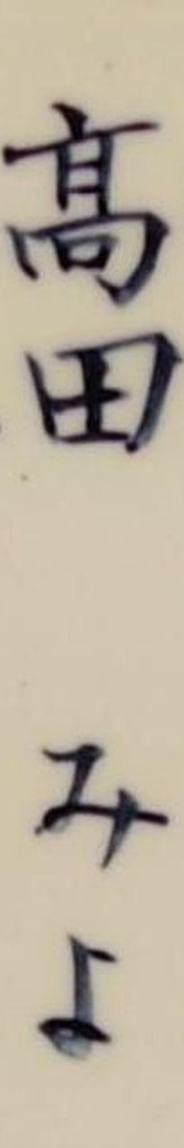高田みよ
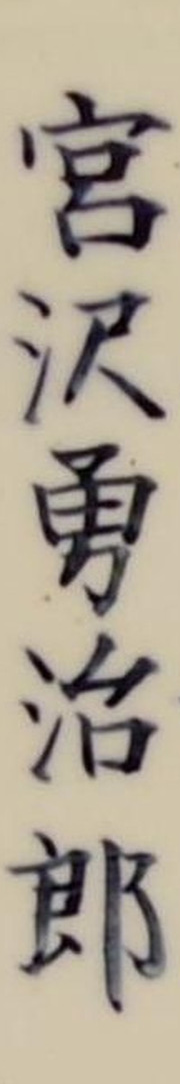宮沢勇治郎
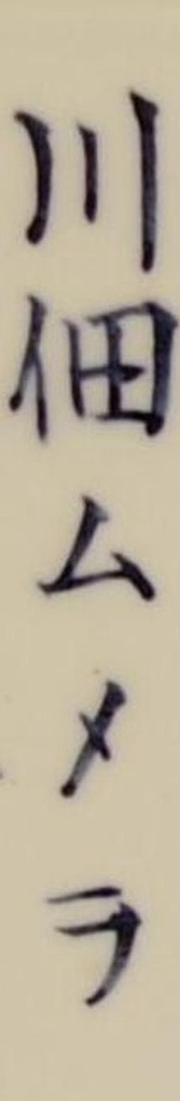川佃ムメヲ
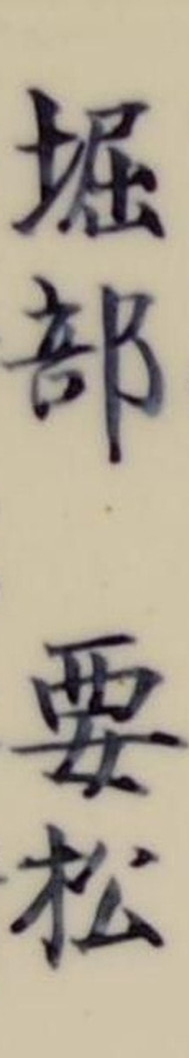堀部要松
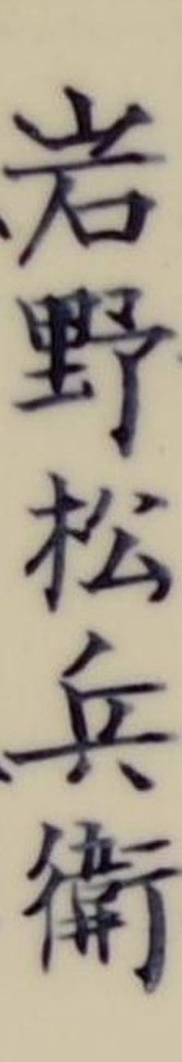岩野松兵衛
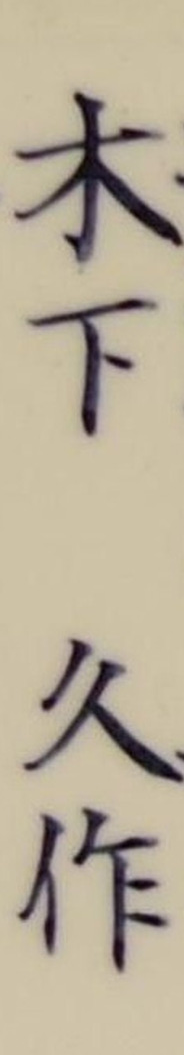木下久作
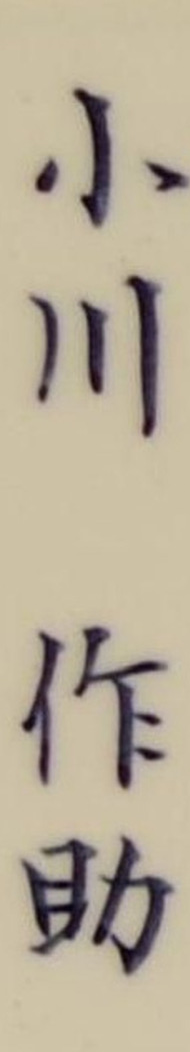小川作助
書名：A~D
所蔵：koyasan kongobuji
